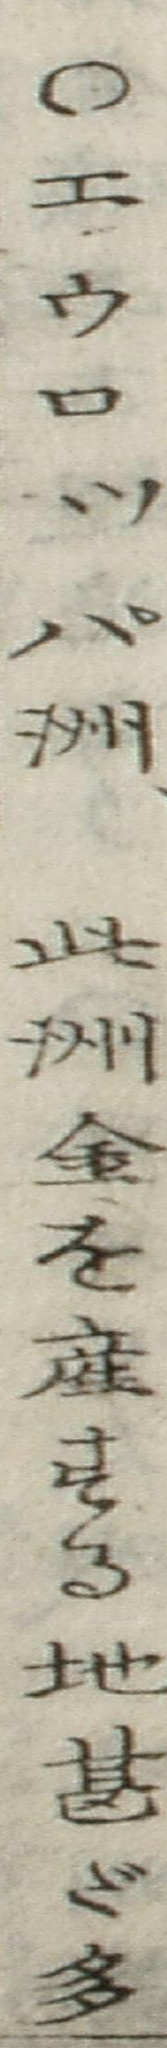○エウロツパ洲、此洲金を産する地甚だ多
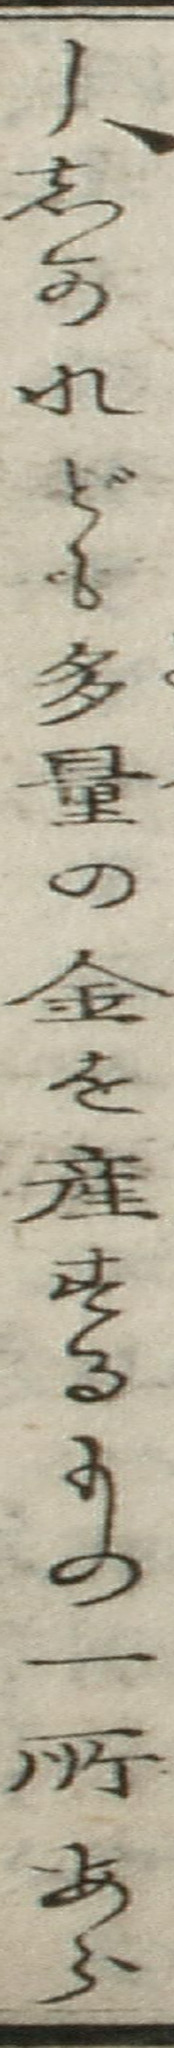し、しかれども多量の金を産するもの一所あら

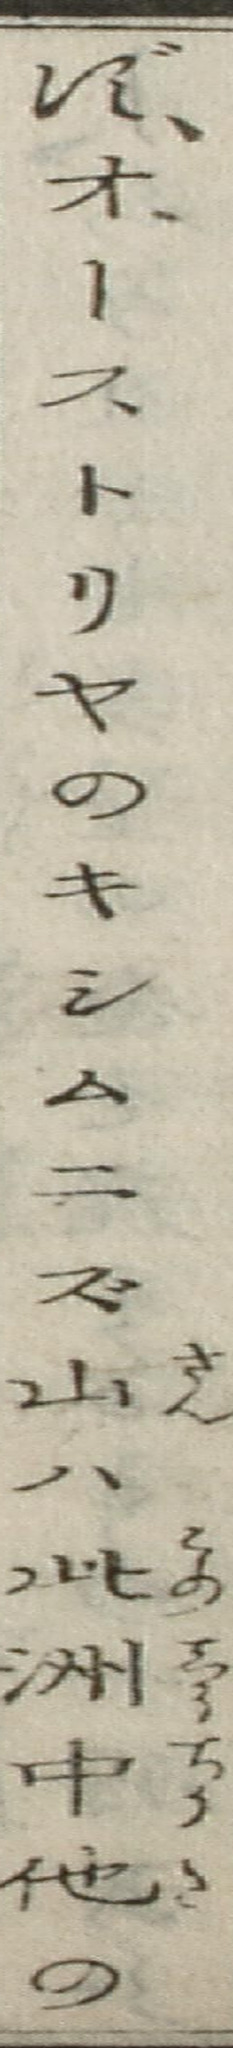ず、オーストリヤのキシムニズ山は此洲中他の
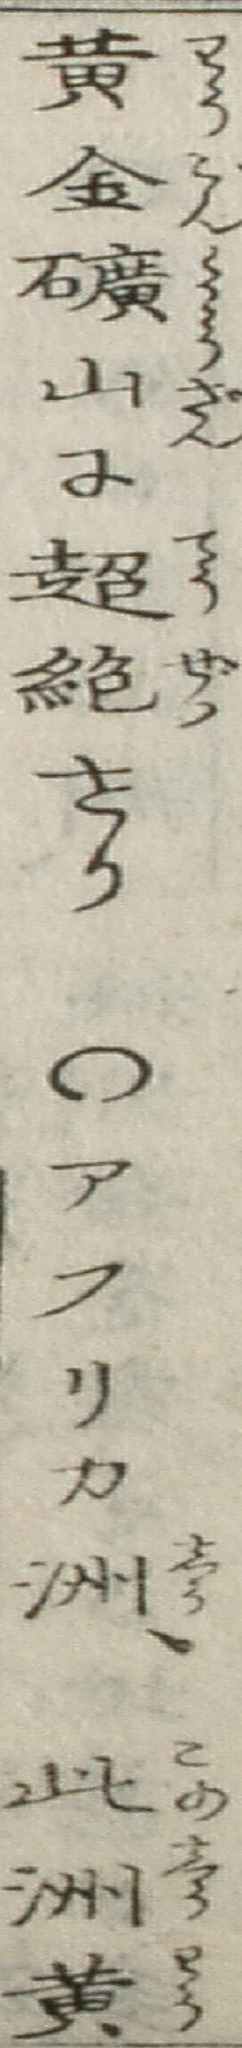黄金砿山に超絶せり○アフリカ洲、此洲黄
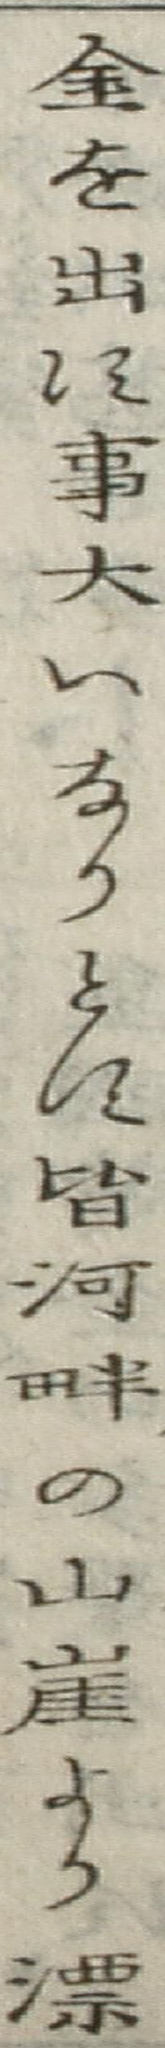金を出す事大いなりとす、皆河畔の山崖より漂
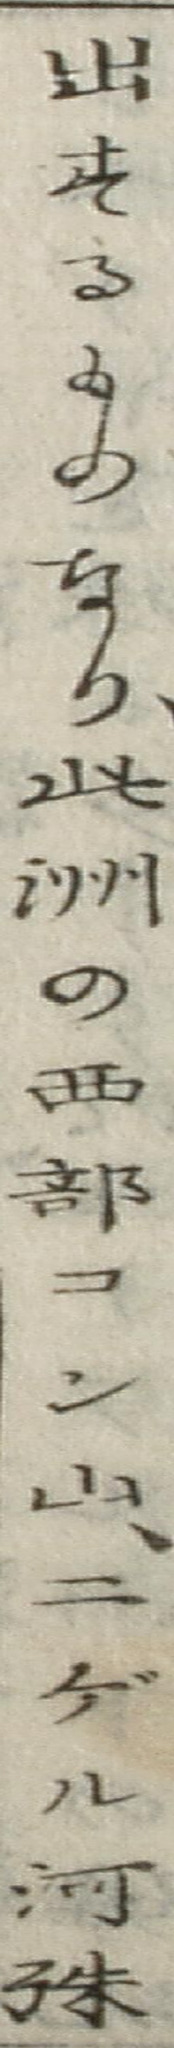出するものなり、此洲の西部コン山、ニゲル河殊
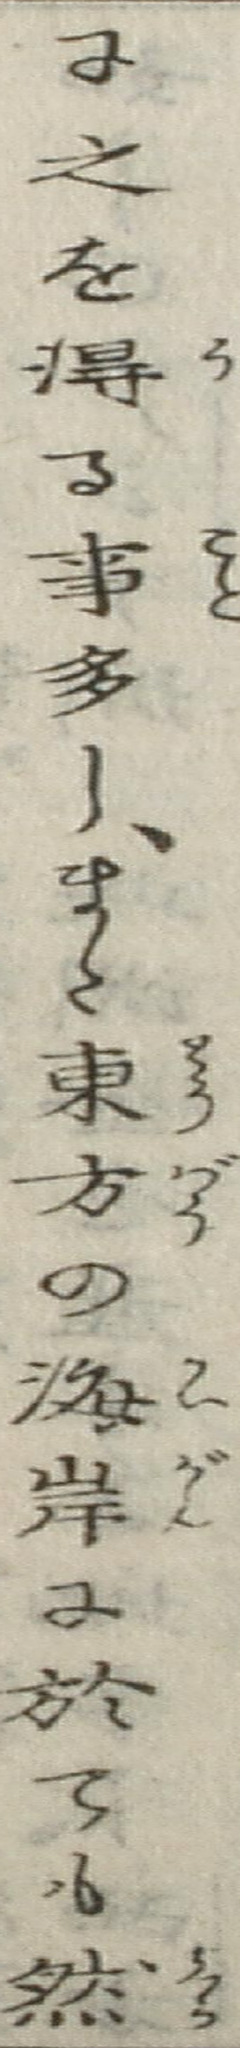に之を得る事多し、また東方の海岸に於ても然
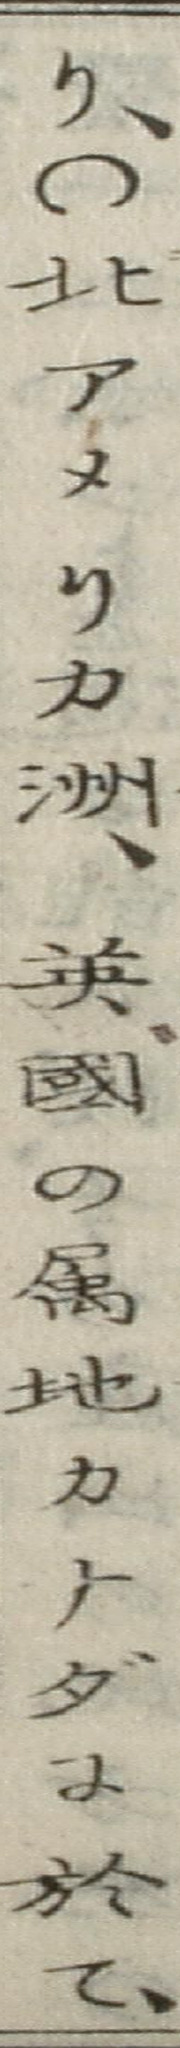り、○北アメリカ洲、英国の属地カナダに於て、
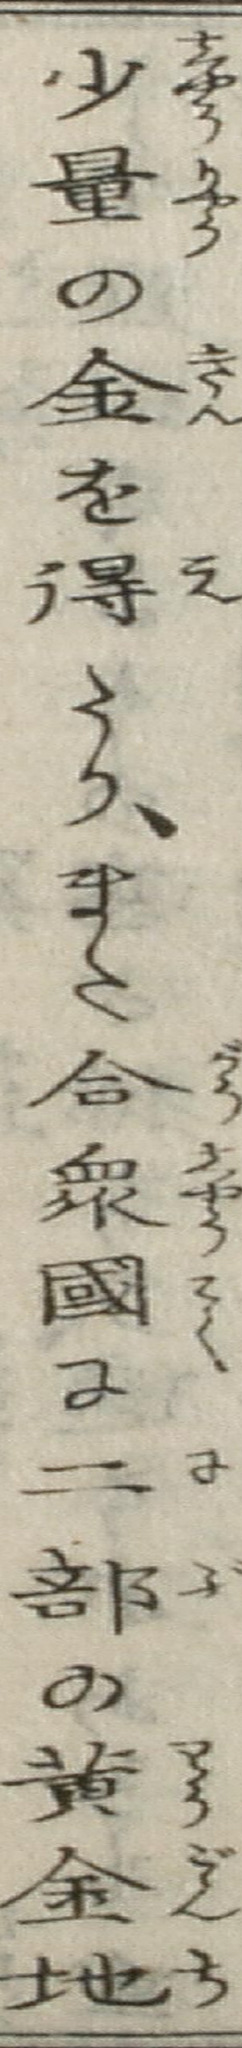少量の金を得たり、また合衆国に二部の黄金地
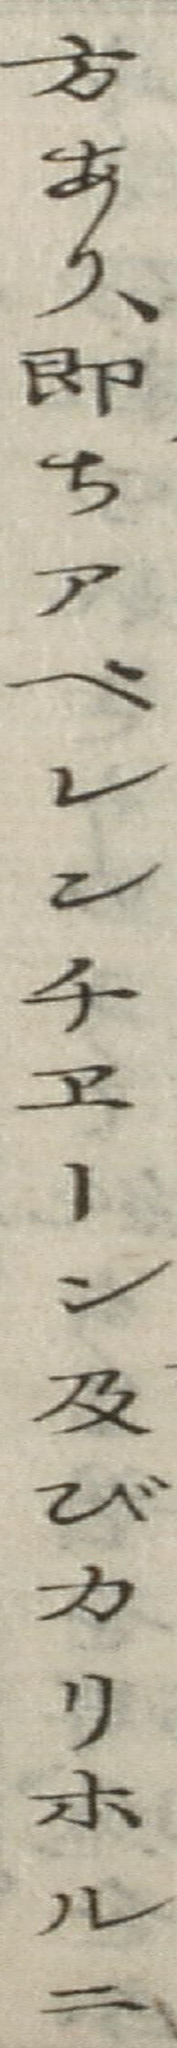方あり、即ちアベレンチエーン及びカリホルニ
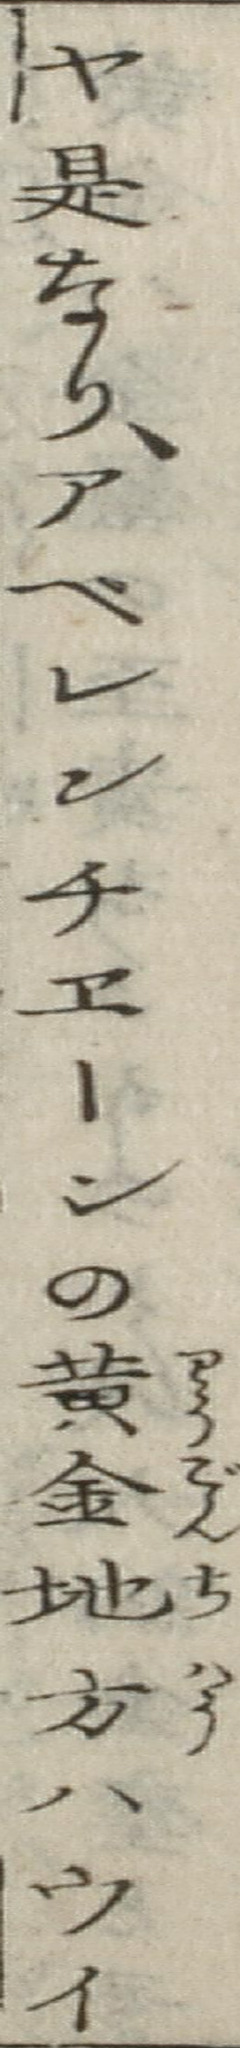ヤ是なり、アベレンチエーンの黄金地方はウイ
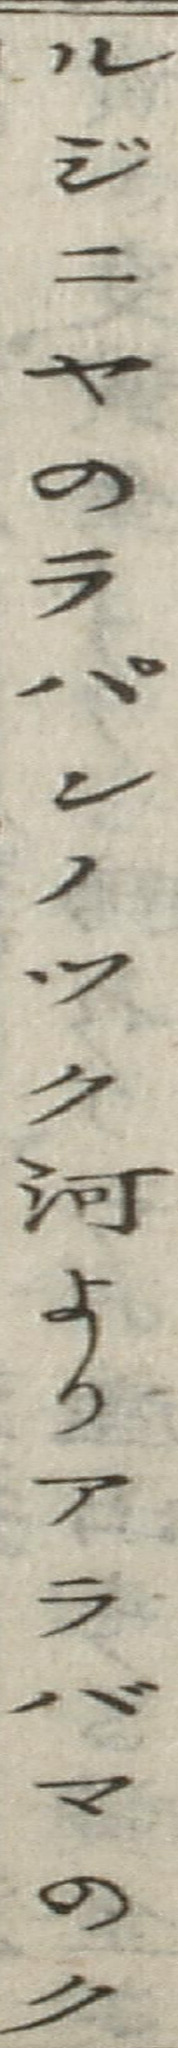ルジニヤのラバンノツク河よりアラバマのク
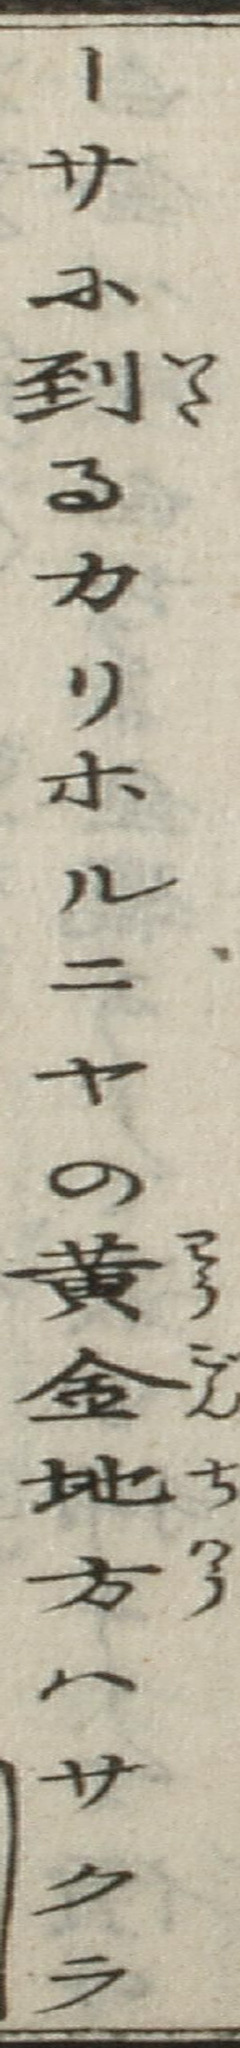ーサに到るカリホルニヤの黄金地方はサクラ
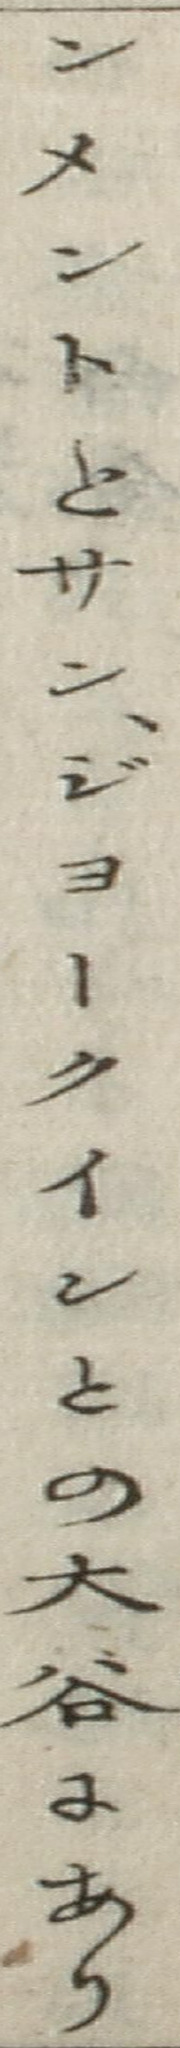ンメントとサン、ジョークインとの大谷にあり
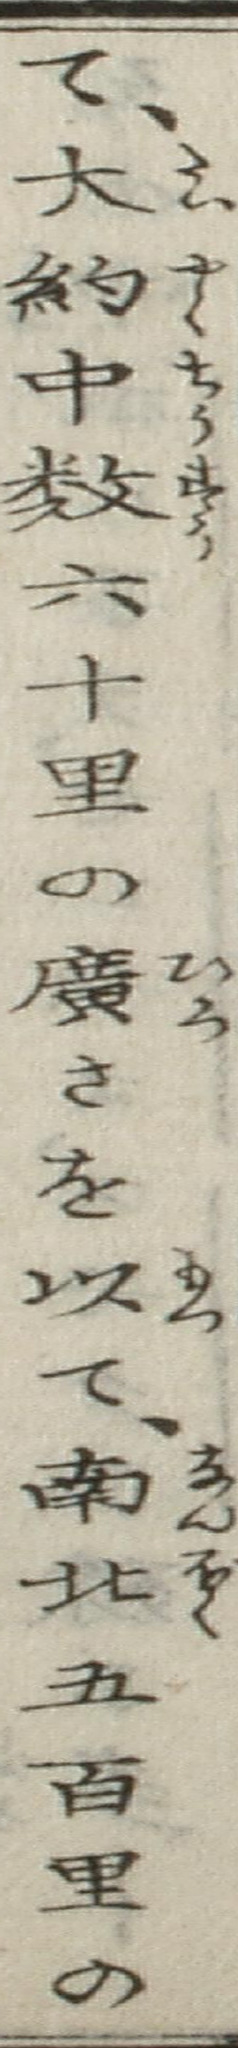て、大約中数六十里の広さを以て、南北五百里の
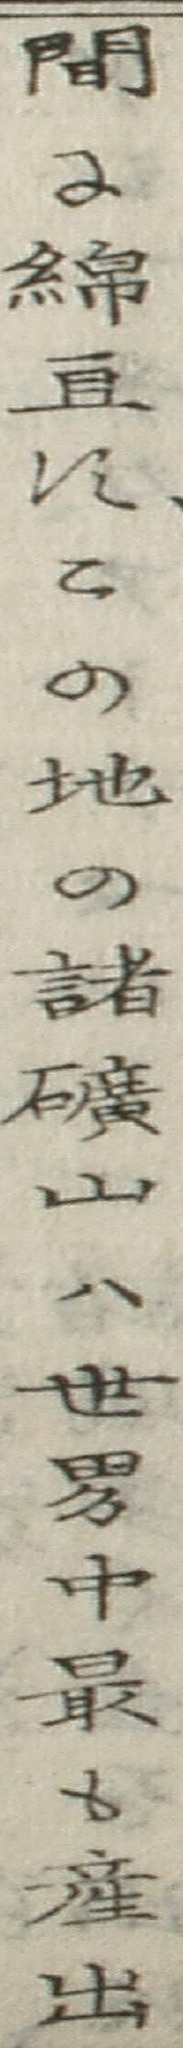間に綿亘す、この地の諸砿山は世界中最も産出
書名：訓蒙　天然地理學　下
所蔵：東京大学地震研究所図書室 Earthquake Research Institute Library, The University of Tokyo, JAPAN
